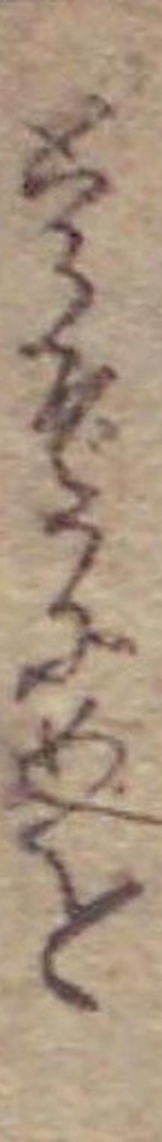とうぞかにめを

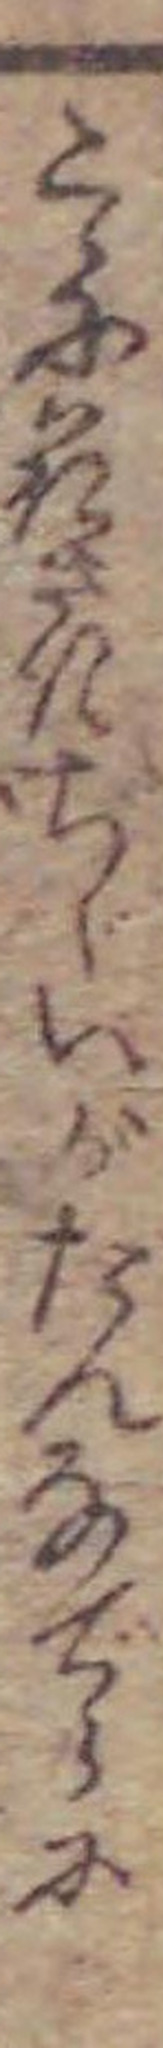こゝに花さきぢゞいがたんなでらに
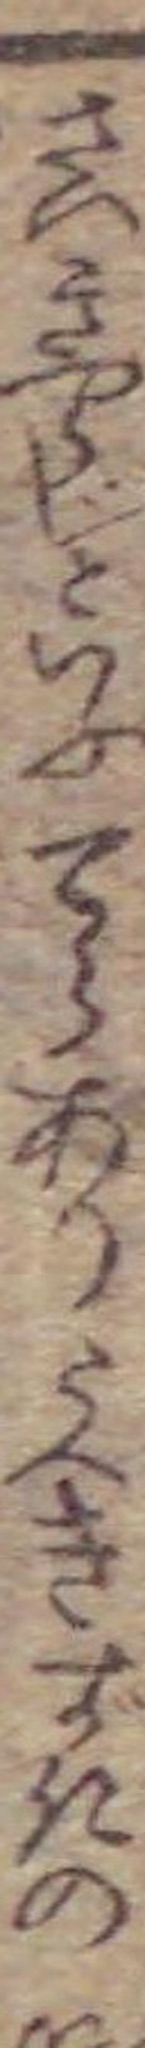さいみようじといふてらありうへきずきの
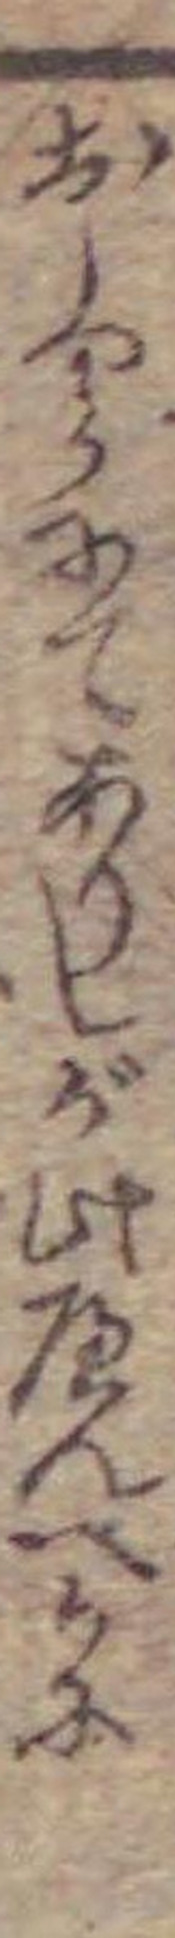おしやうにてありしが此へんへかに
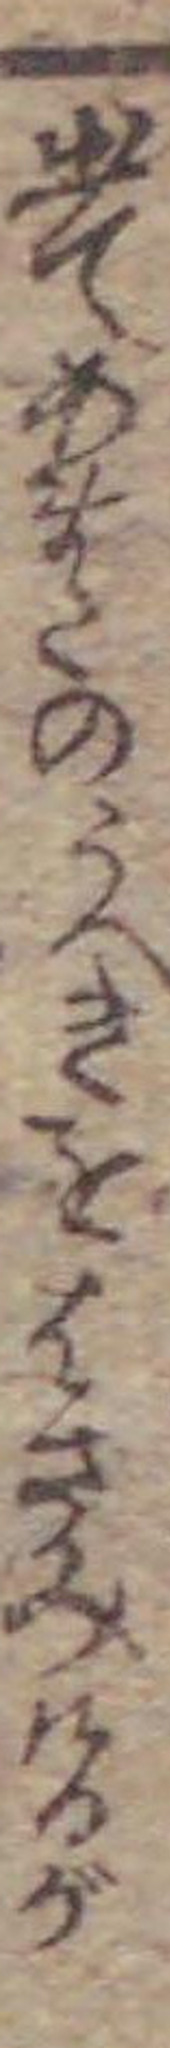出てあまたのうへきをはさみけるが
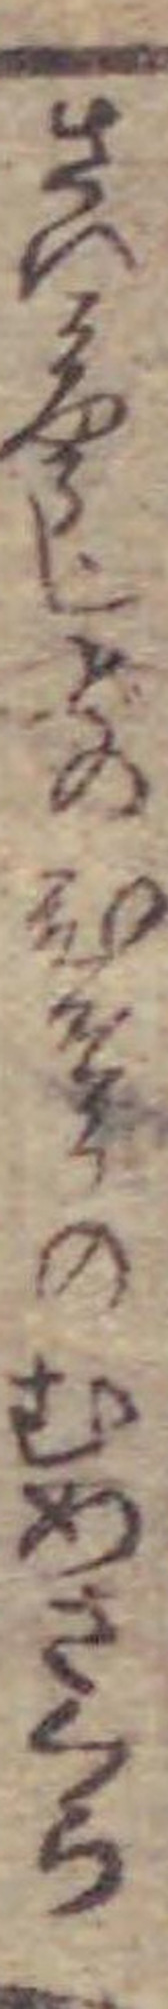さいきようじどのひそうのむめさくら
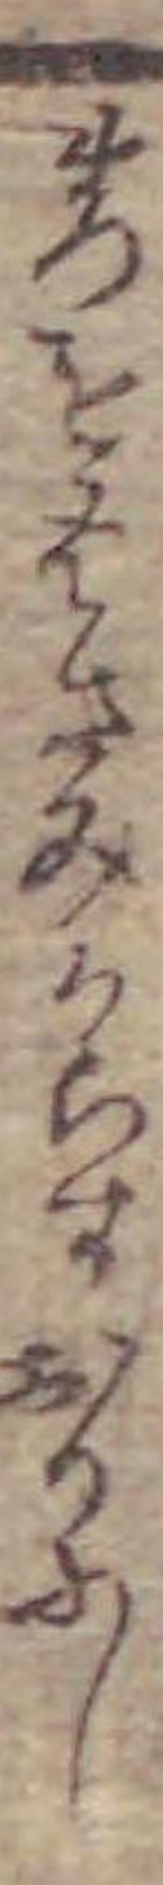まつをはさみからすおりふし
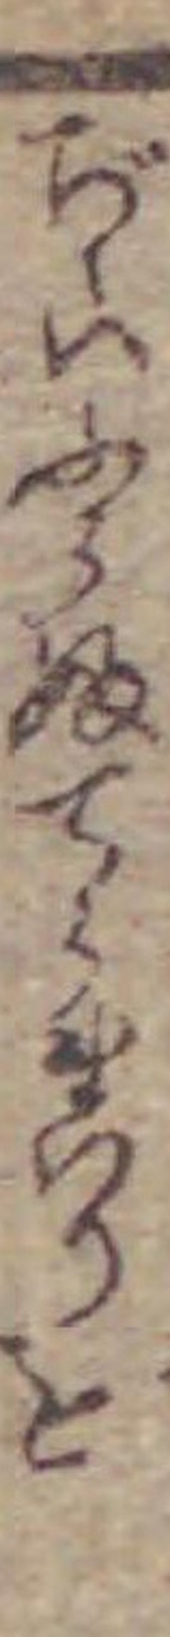ぢゝいふうふてらまいりを
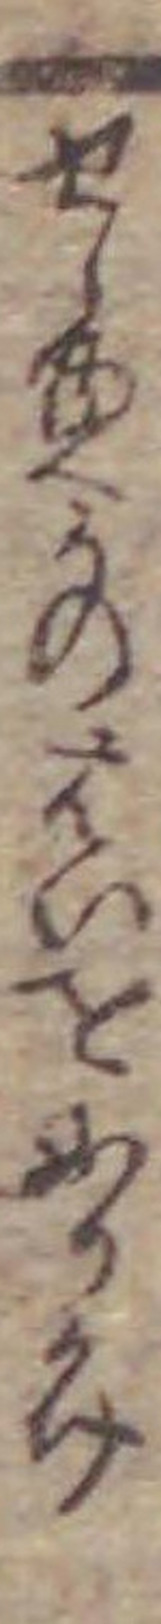せしゆへかのはいをふりかけ
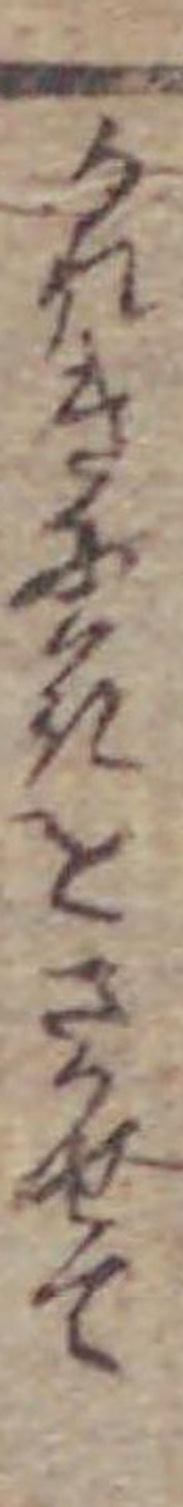かれきに花をさかせて
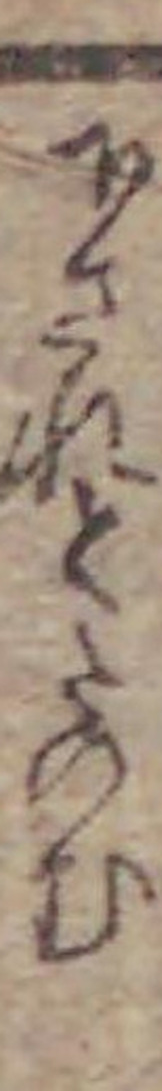下されとたのむ
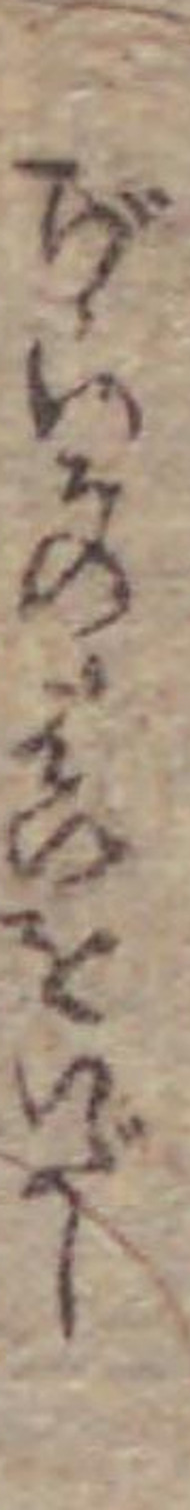ぢゝいかのはいをいだし
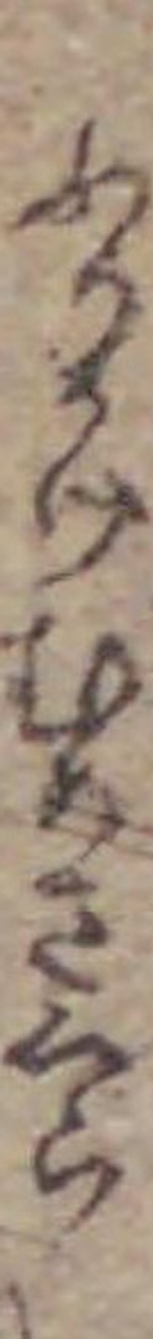ふりかけむめさくら
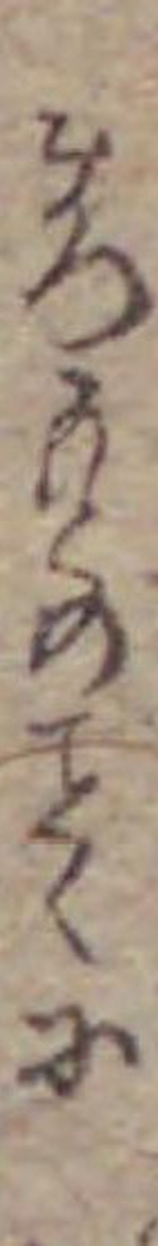まつもとのことくに
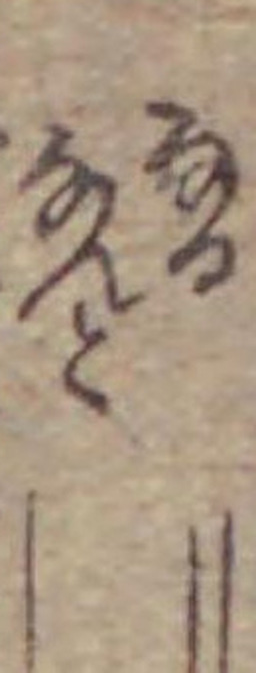なんと
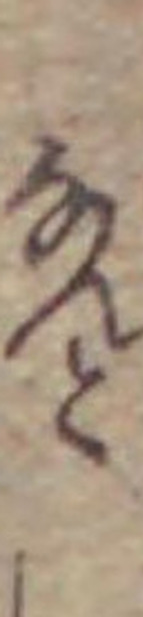なんと
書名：交古勢昔咄 : 2巻
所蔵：国立国会図書館 National Diet Library, JAPAN
